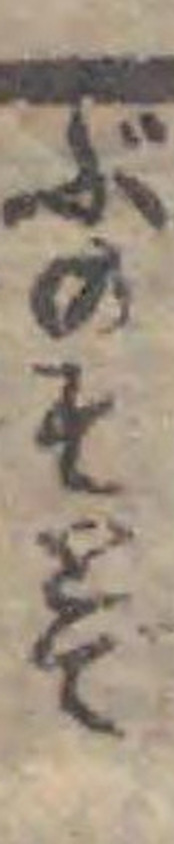ぶのそとて
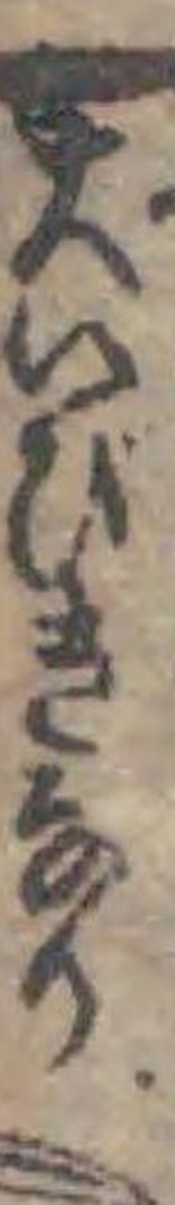大いびきなり
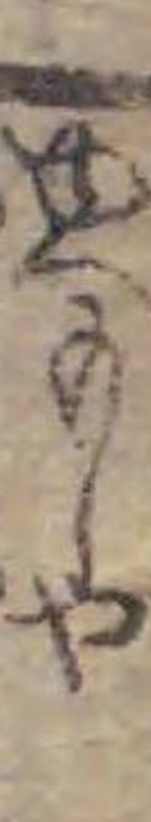ゆへもしや
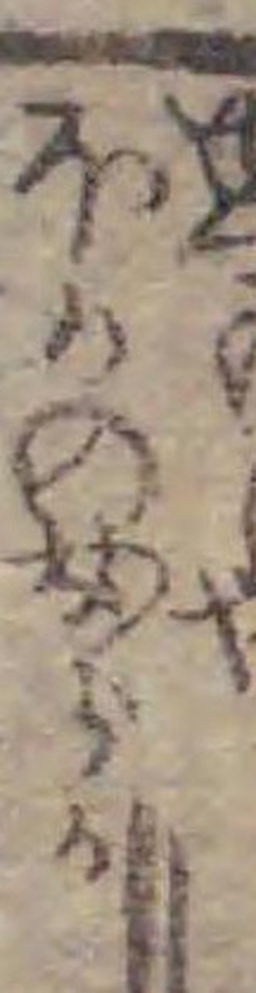ほかの女郎か
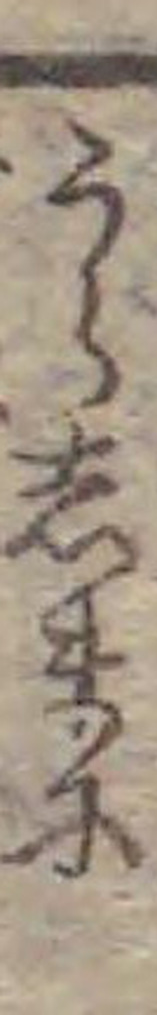うらしまに
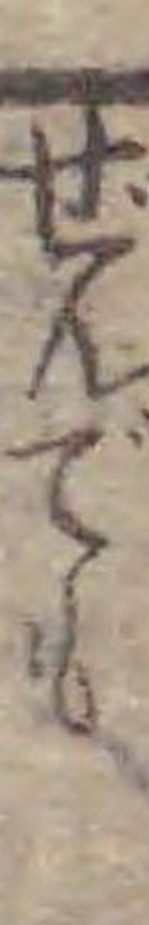ぜんでも
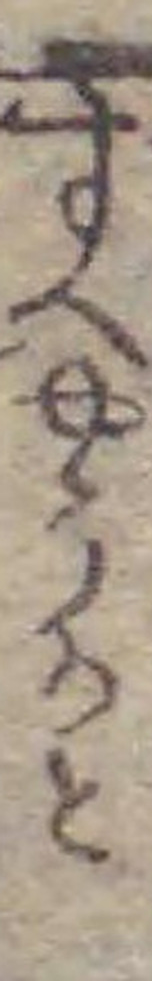すへやうかと
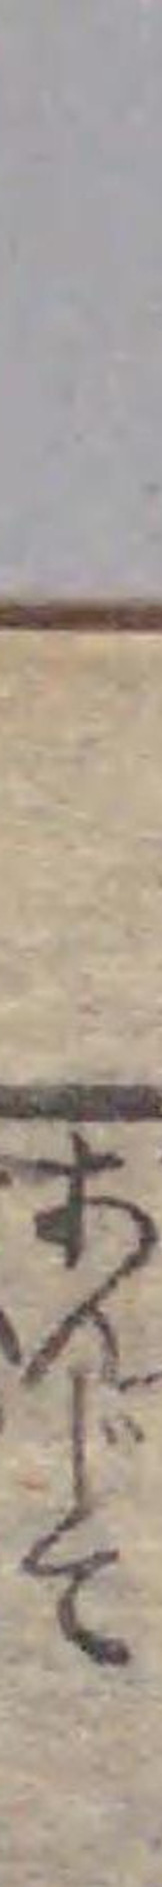あんじて
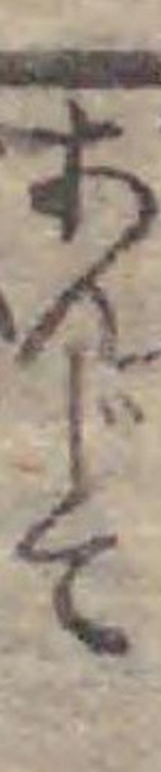あんじて
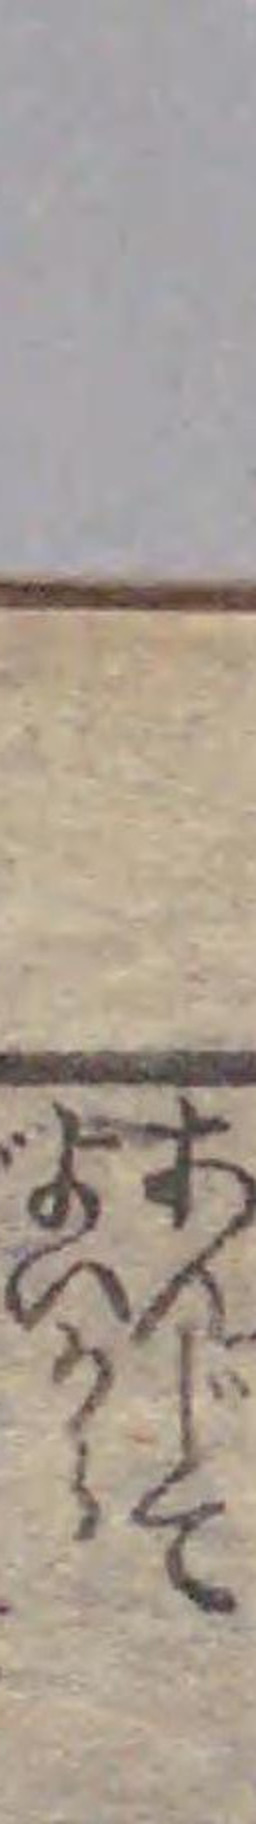よいから
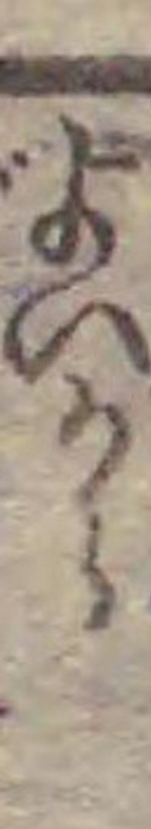よいから
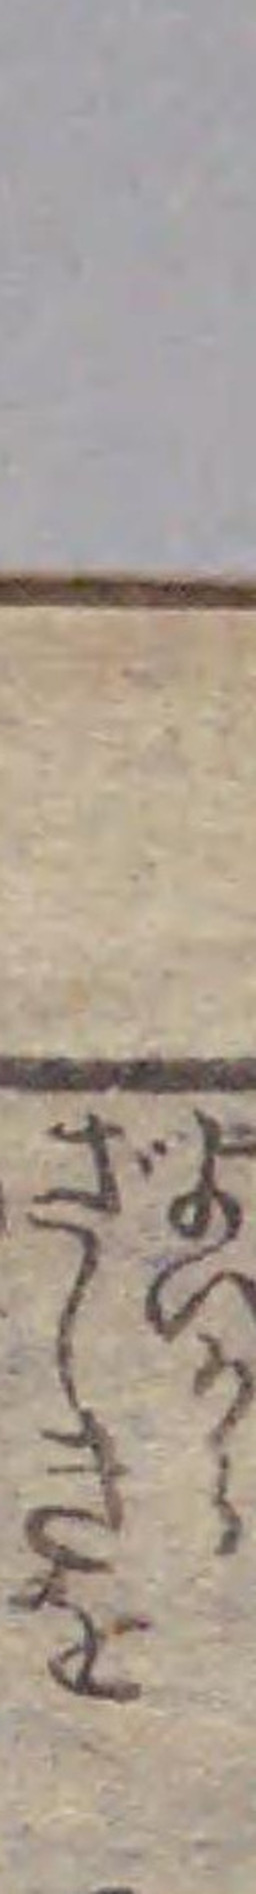ざしきを
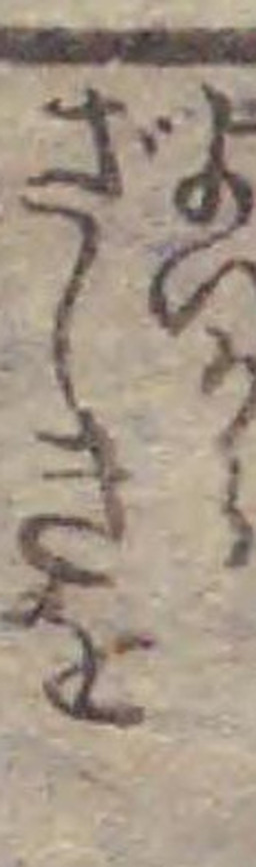ざしきを
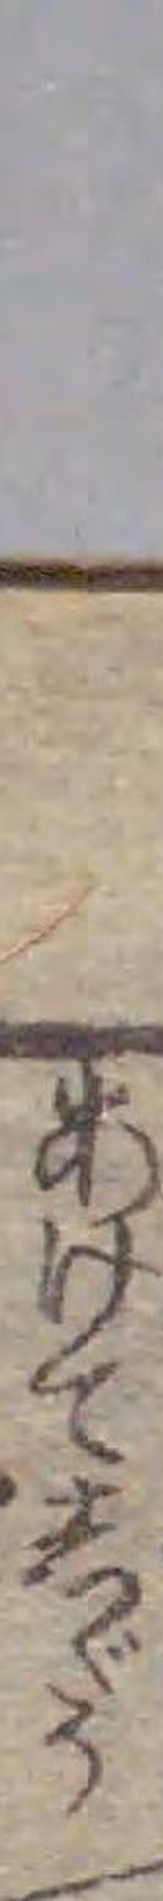あけてしゞう
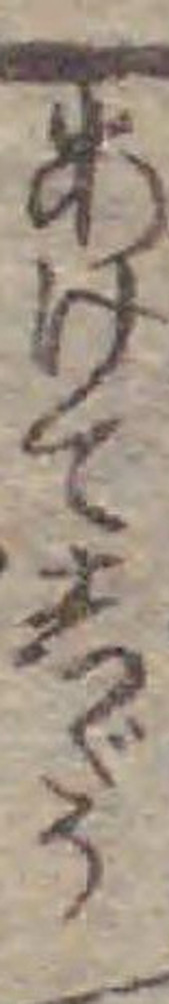あけてしゞう
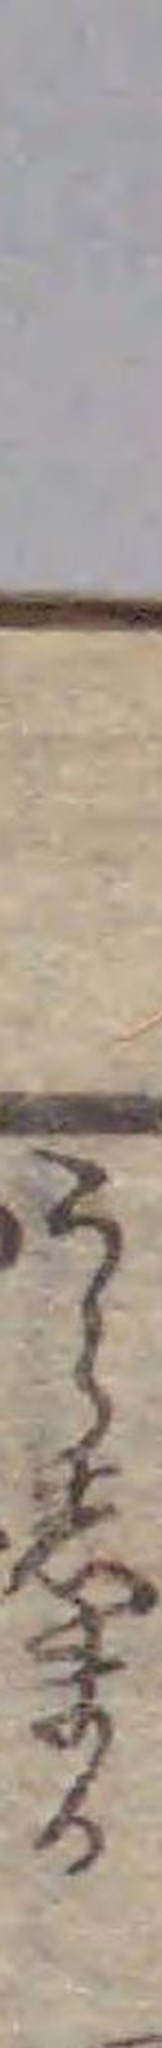うらしまに
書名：竜宮苦界玉手箱 : 3巻
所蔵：国立国会図書館 National Diet Library, JAPAN
